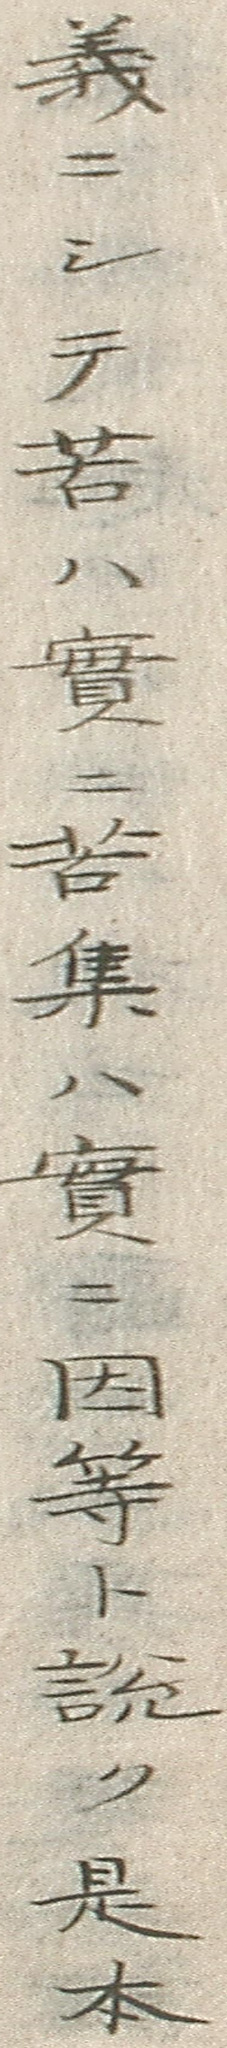義ニシテ苦ハ実ニ苦集ハ実ニ因等ト説ク是本
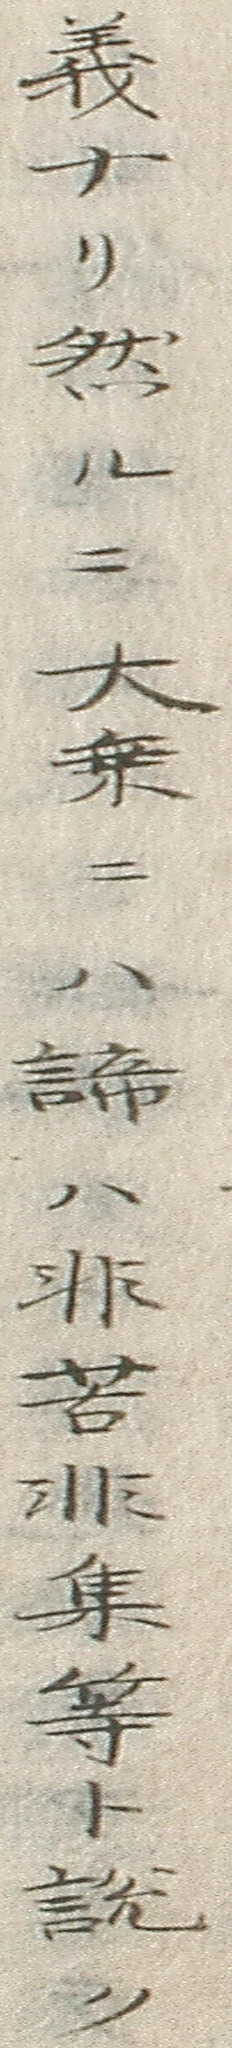義ナリ然ルニ大乗ニハ諦ハ非苦非集等ト説ク
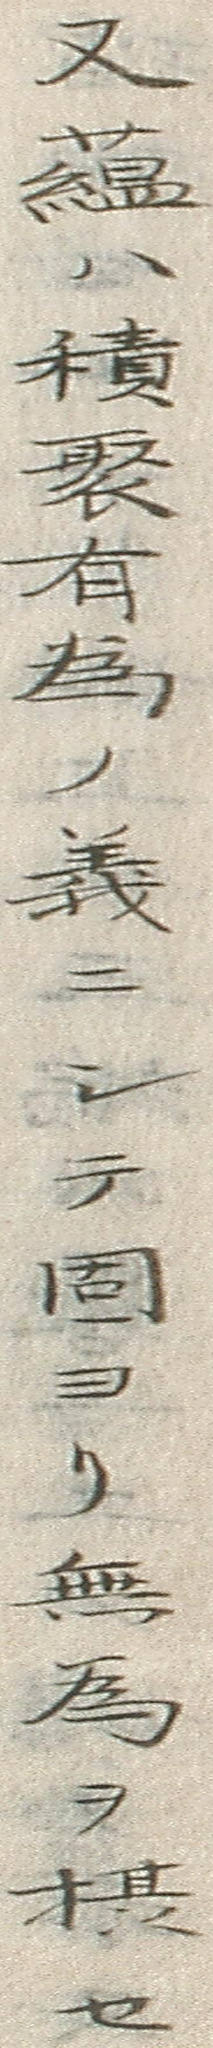又蘊ハ積聚有為ノ義ニシテ固ヨリ無為ヲ摂セ
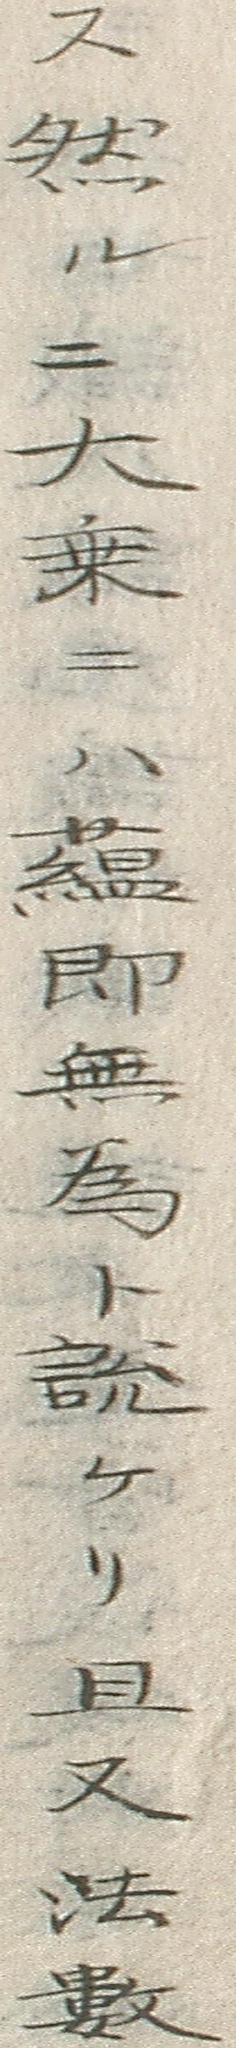ス然ルニ大乗ニハ蘊即無為ト説ケリ且又法数
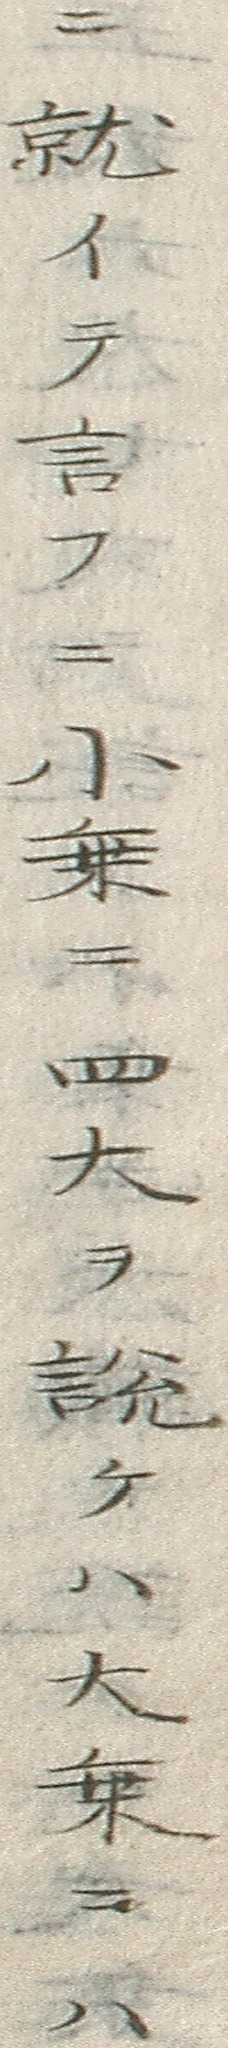ニ就イテ言フニ小乗ニ四大ヲ説ケハ大乗ニハ

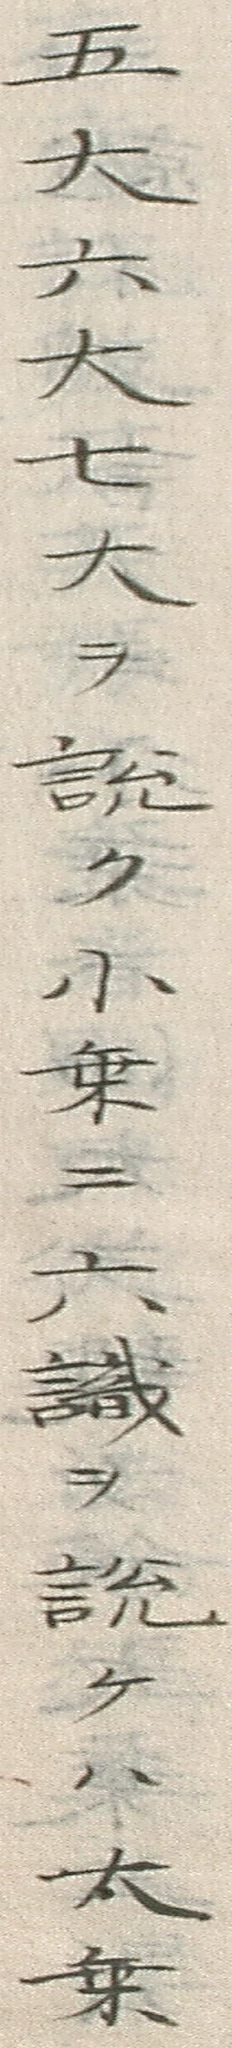五大六大七大ヲ説ク小乗ニ六識ヲ説ケハ大乗
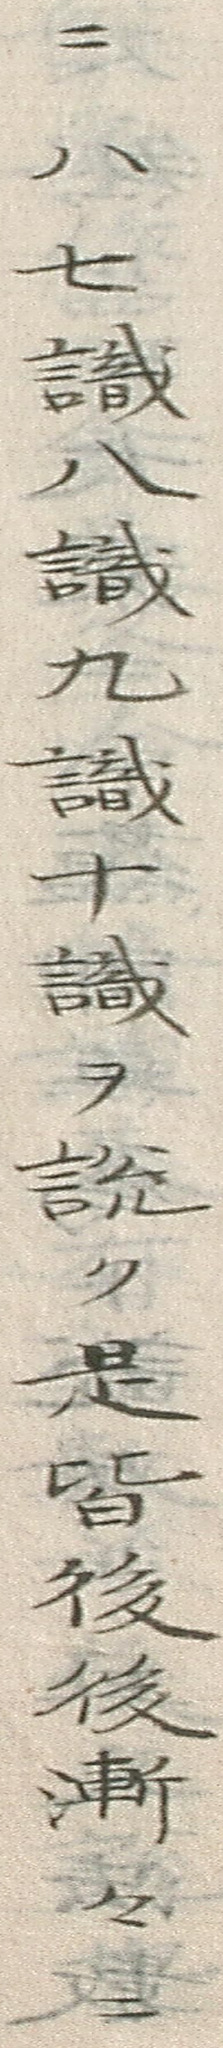ニハ七識八識九識十識ヲ説ク是皆後後漸々ニ
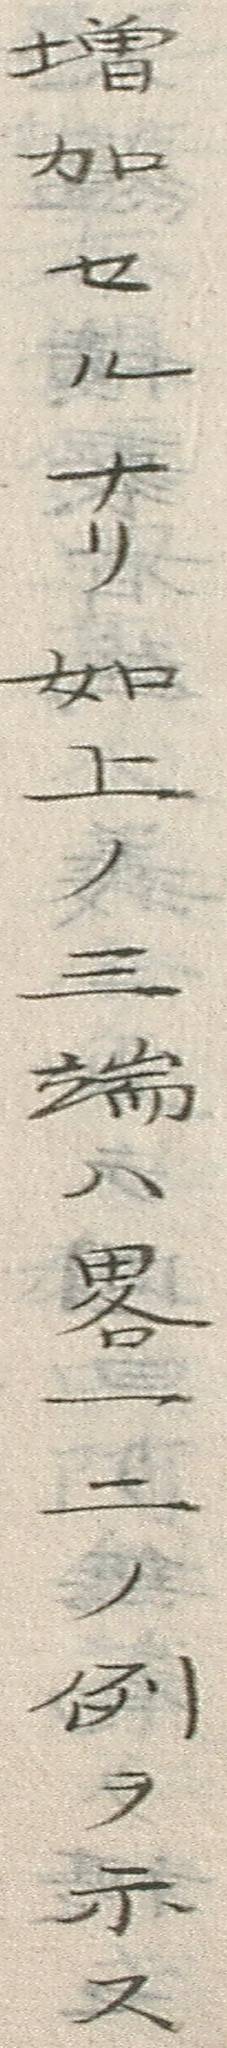増加セルナリ如上ノ三端ハ略一二ノ例ヲ示ス
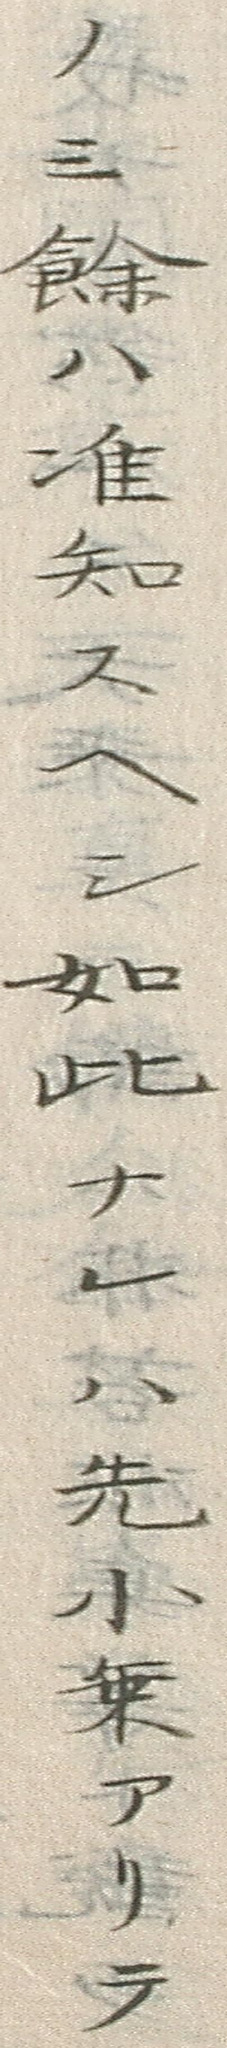ノミ余ハ准知スヘシ如此ナレハ先小乗アリテ
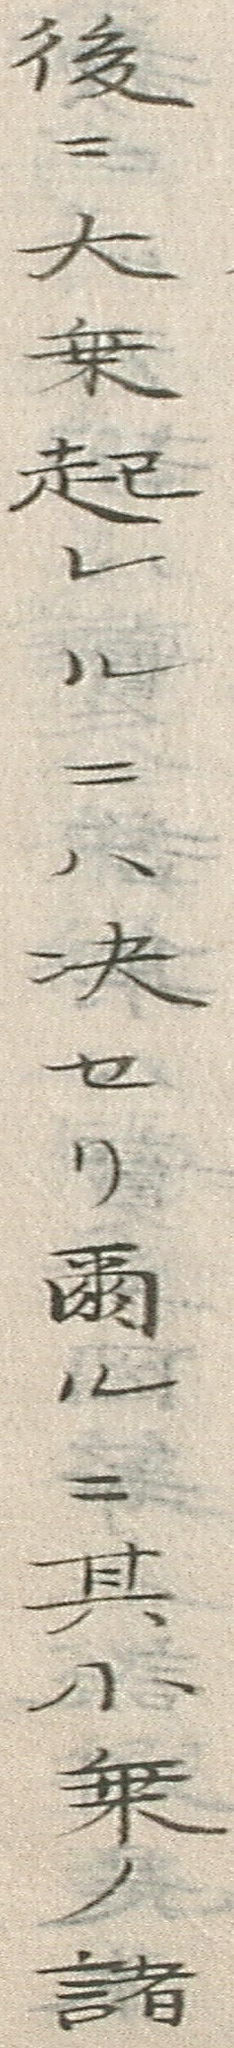後ニ大乗起レルニハ决セリ爾ルニ其小乗ノ諸
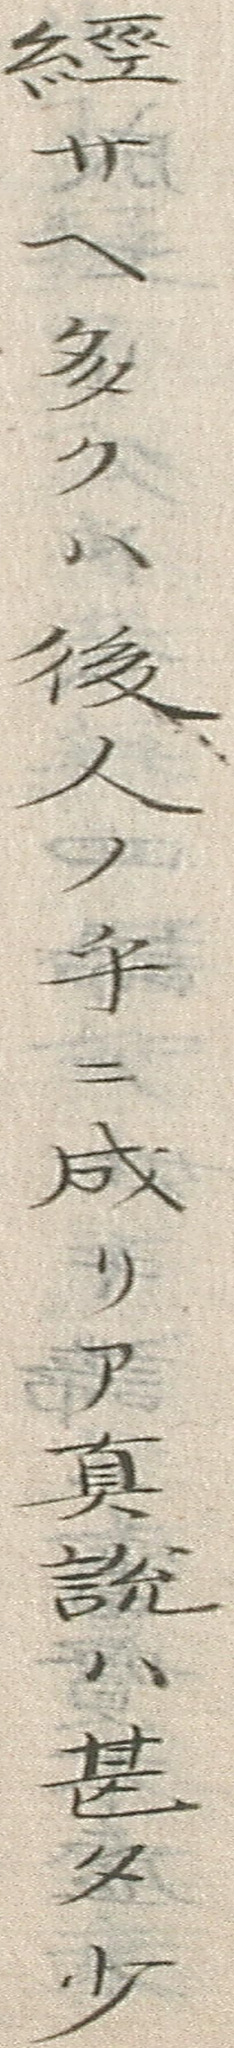経サヘ多クハ後人ノ乎ニ成リア真説ハ甚タ少
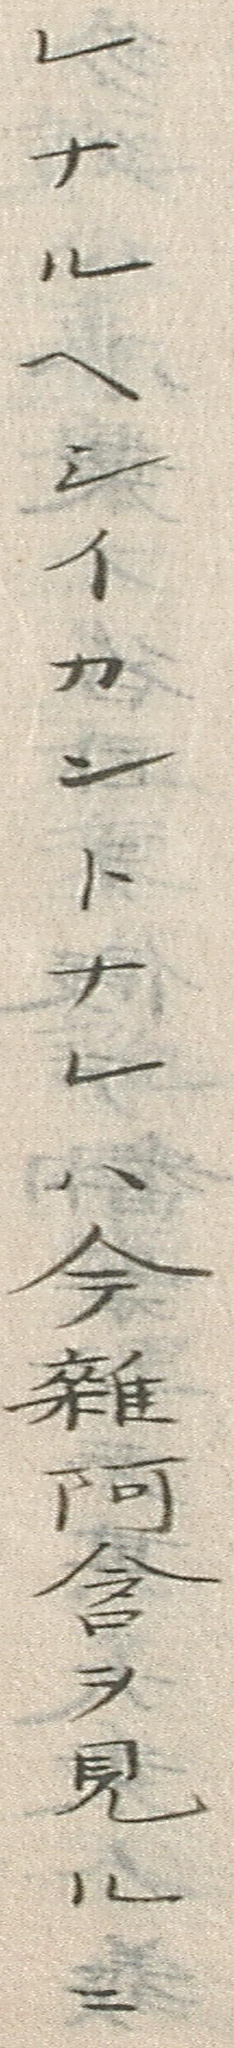レナルヘシイカントナレハ今雑阿含ヲ見ルニ
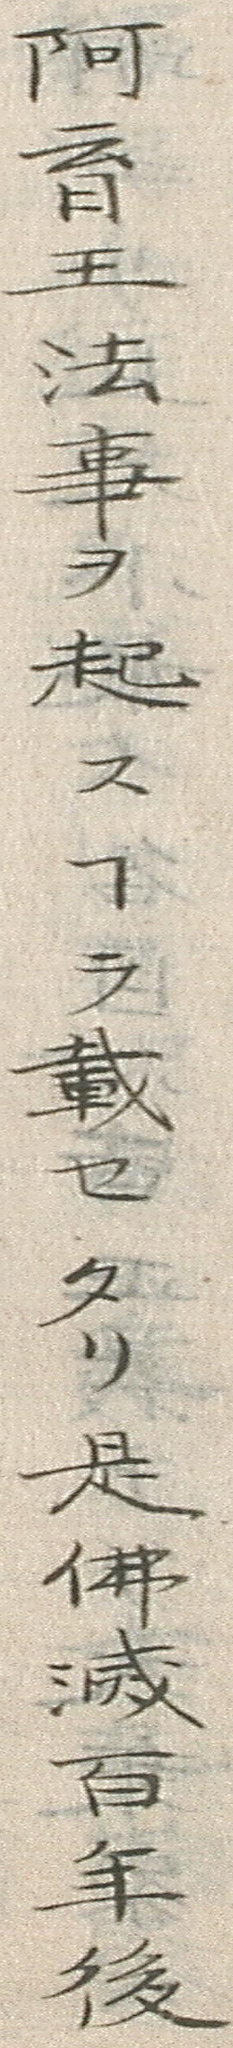阿育王法事ヲ起スコトヲ載セタリ是仏滅百年後
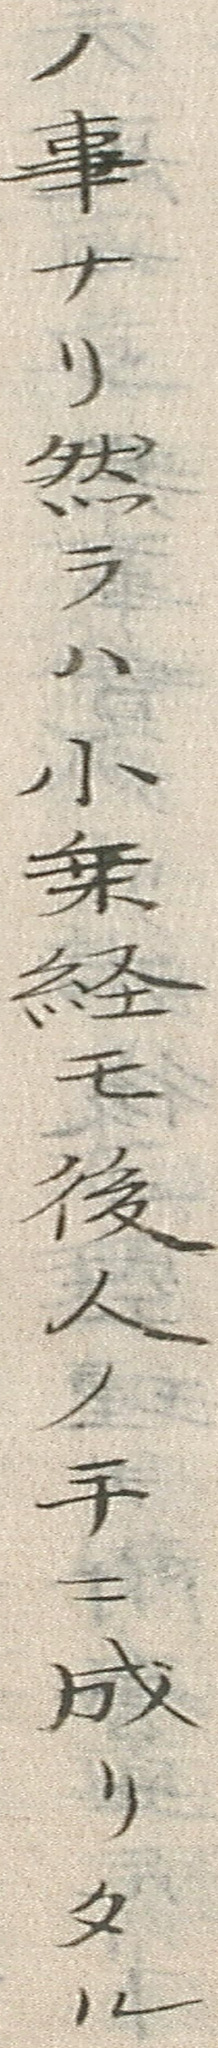ノ事ナリ然ラハ小乗経モ後人ノ手ニ成リタル
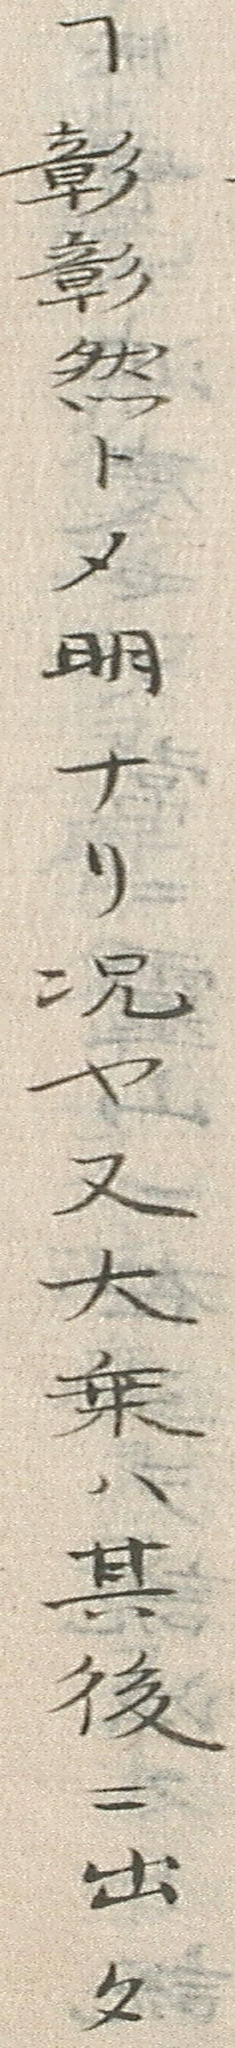コト彰彰然トシテ明ナリ況ヤ又大乗ハ其後ニ出タ
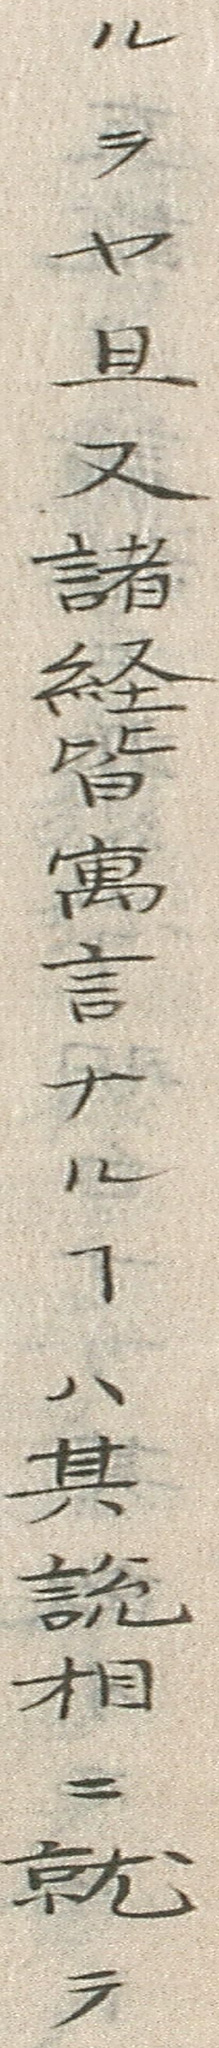ルヲヤ且又諸経皆寓言ナルコトハ其説相ニ就テ
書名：天學略名目羽翼　全
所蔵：東京大学地震研究所図書室 Earthquake Research Institute Library, The University of Tokyo, JAPAN
